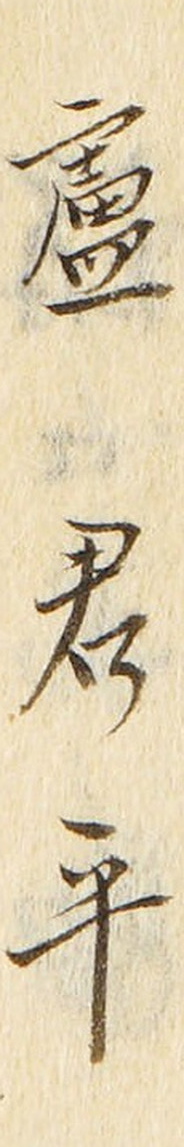廬君平
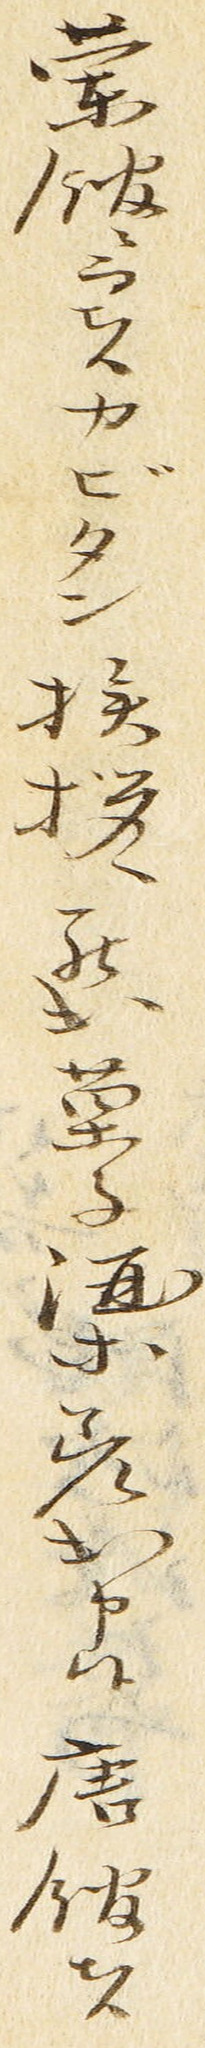？館に而はカビタン挨拶へ罷出菓子酒等差出申候唐館は
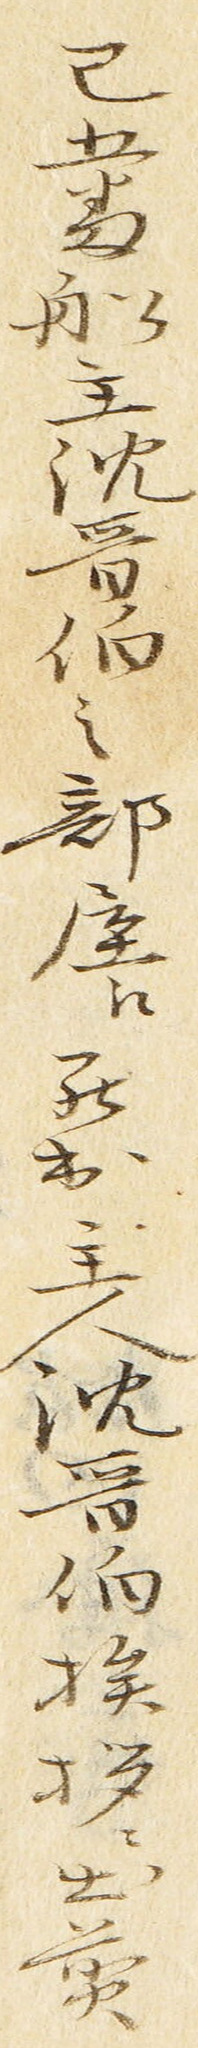己五番船主沈晋伯之部屋江罷出主人沈晋伯挨拶に出？
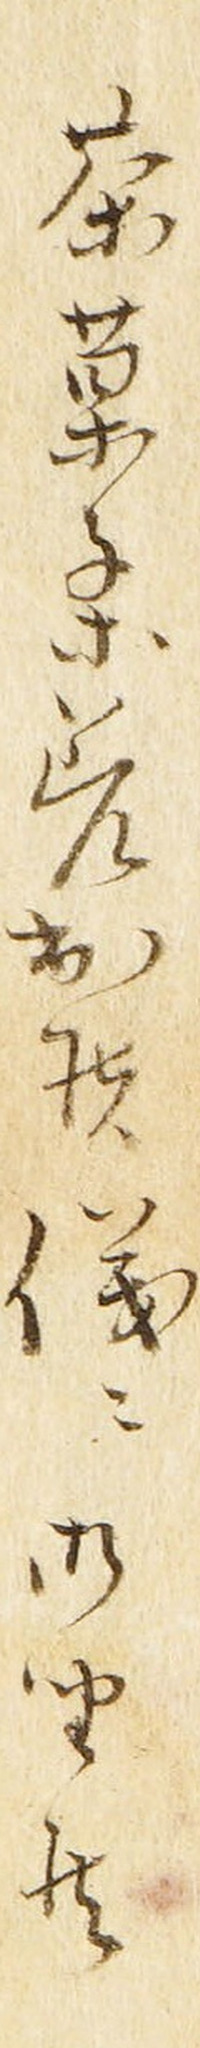茶菓子等差出候儀に御座候
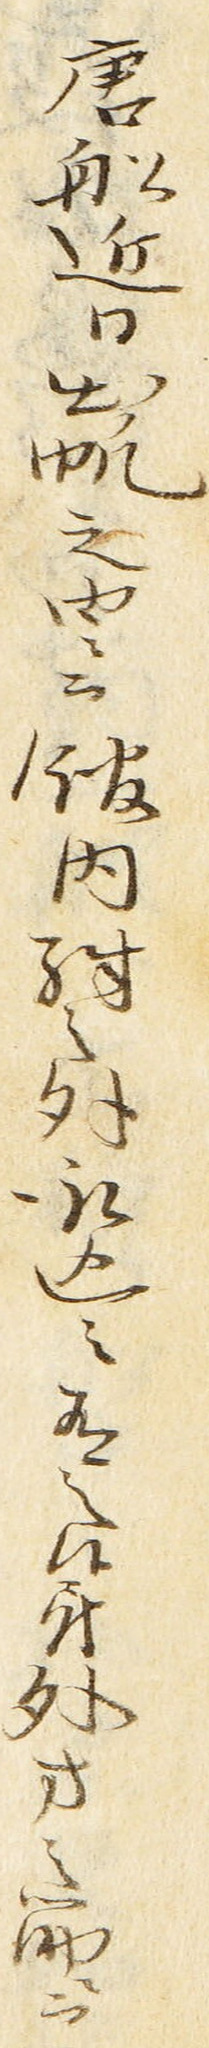唐船近日出帆之由に而館内殊之外取廻之有之候に付外方之筋に而は
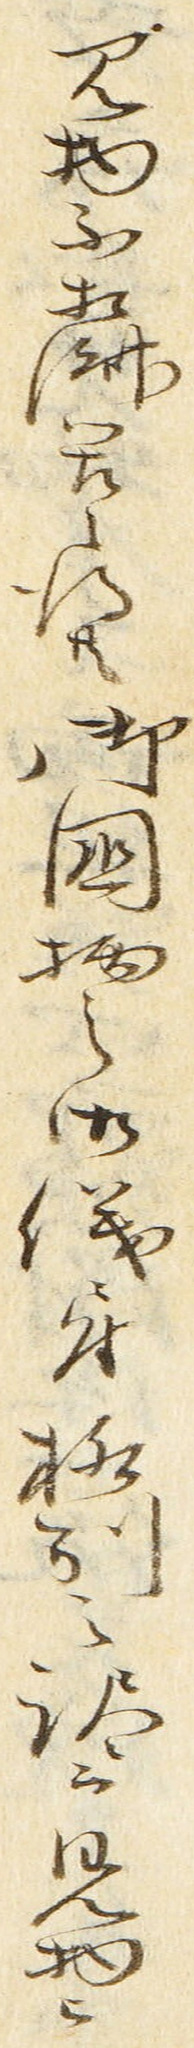見物不相済御左候得共御国柄之御儀に付格別之訳に而見物に
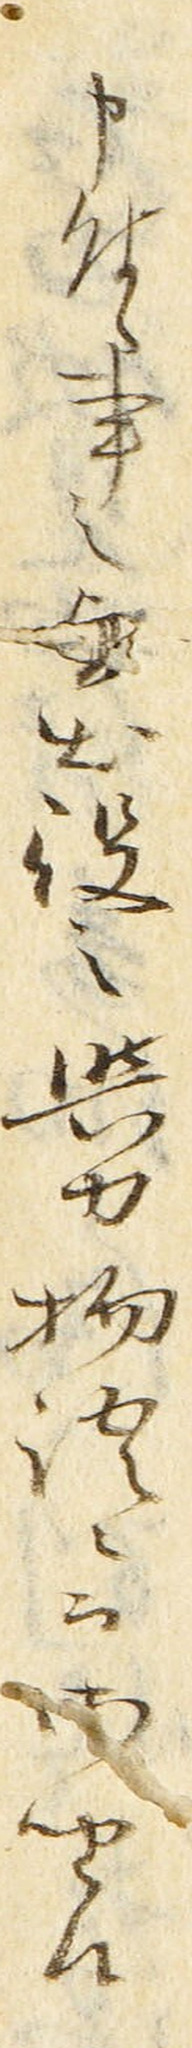申付候事之旨出役之与力物語に而御座候

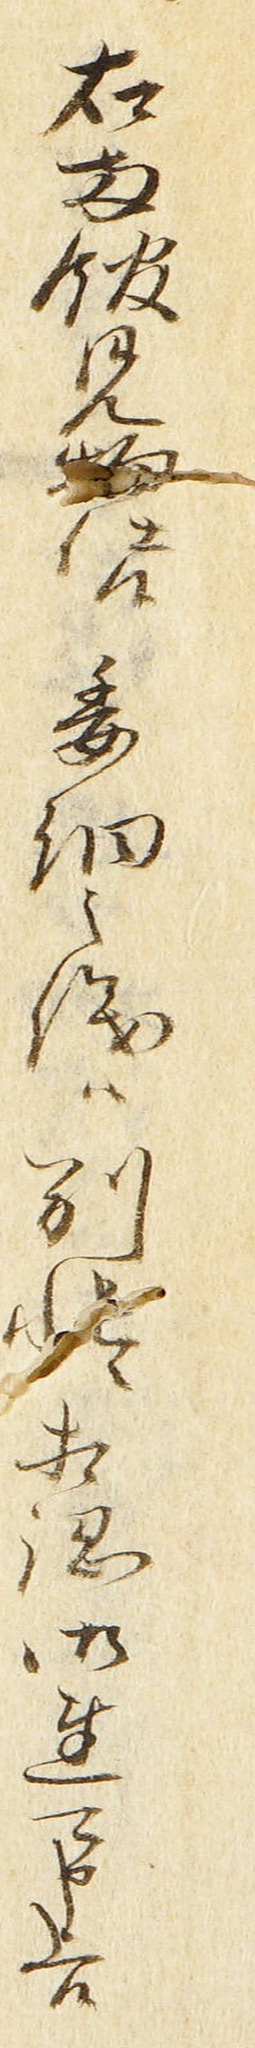右両館見物仕候委細之儀は別帳相認御達可申上候
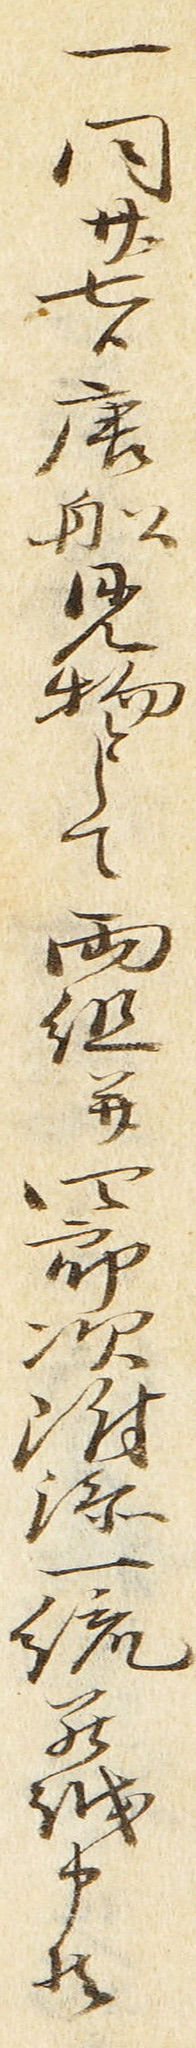一同廿七日唐船見物として両組並四郎次附添一統罷越申候
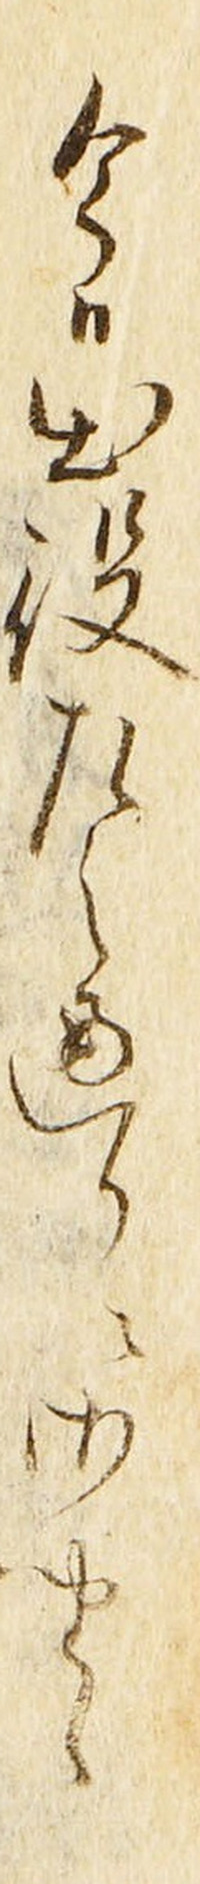今日出役左之通りに御座候
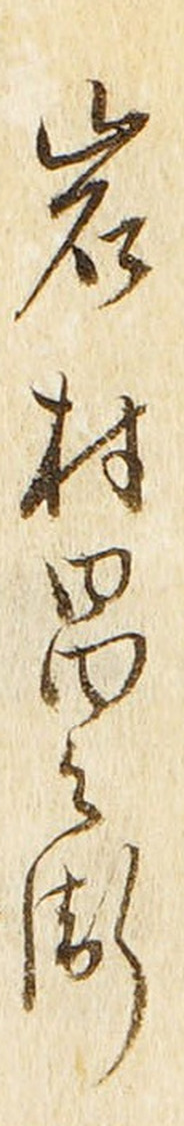岩村昌兵衛
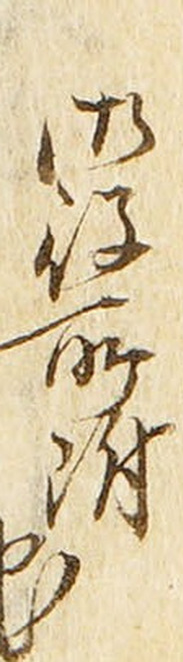御役所附
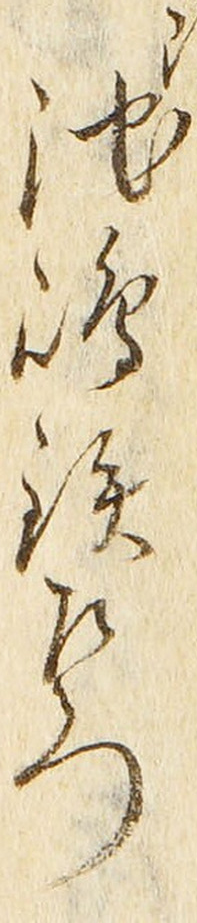池嶋鉄左衛門
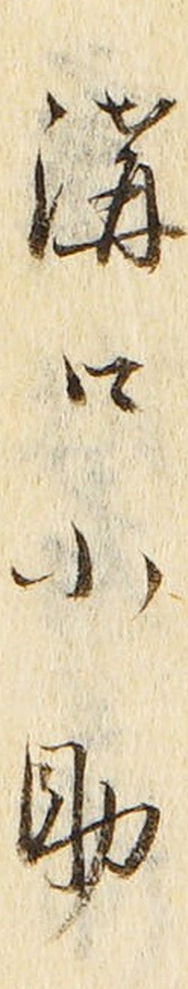溝口小助
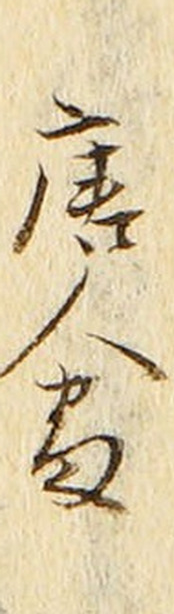唐人番
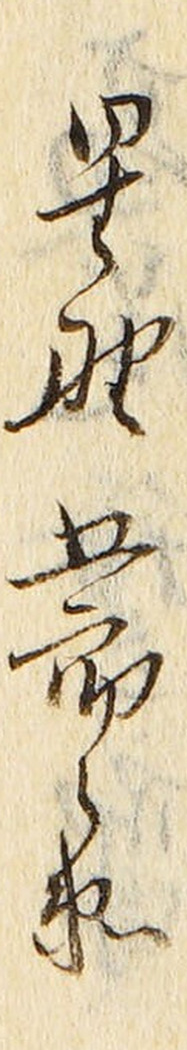貴野五郎兵衛
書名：長崎漂流記
